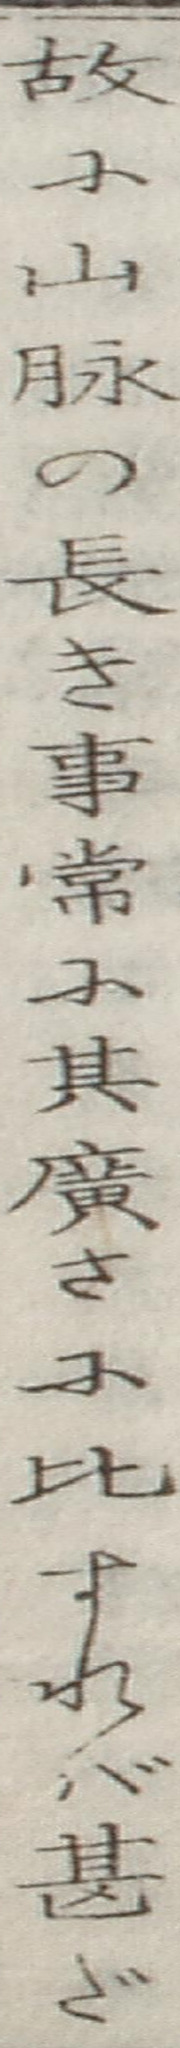故に山脈の長き事常に其廣さに比すれば甚だ

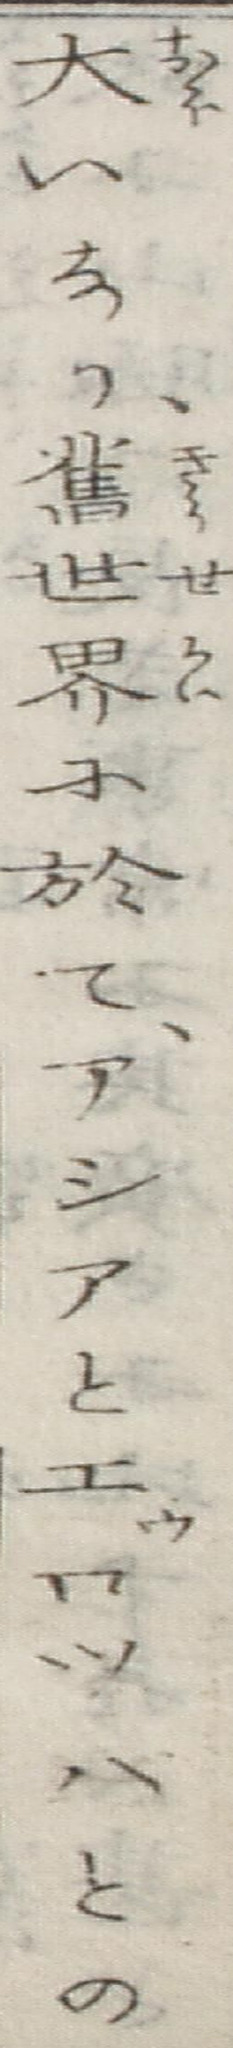大いなり、旧世界に於て、アシアとエゥロツパとの
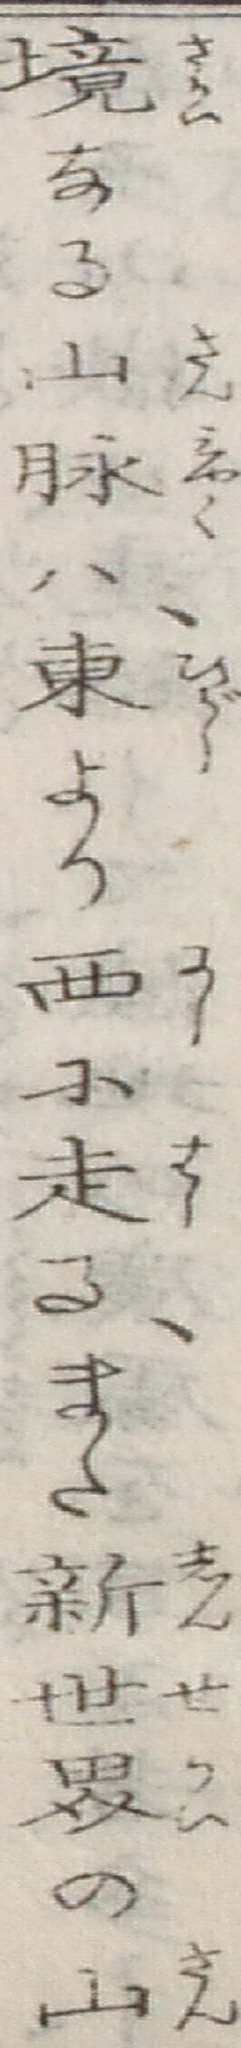境なる山脈は、東より西に走る、また新世界の山
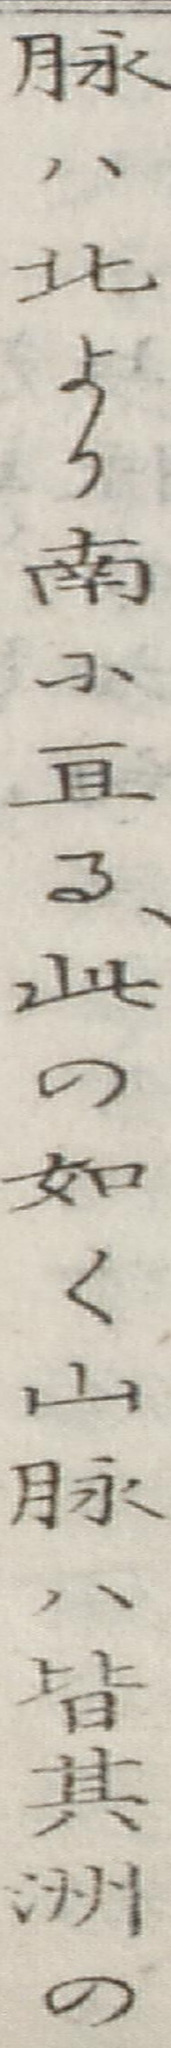脈は北より南に亘る、此の如く山脈は皆其洲の
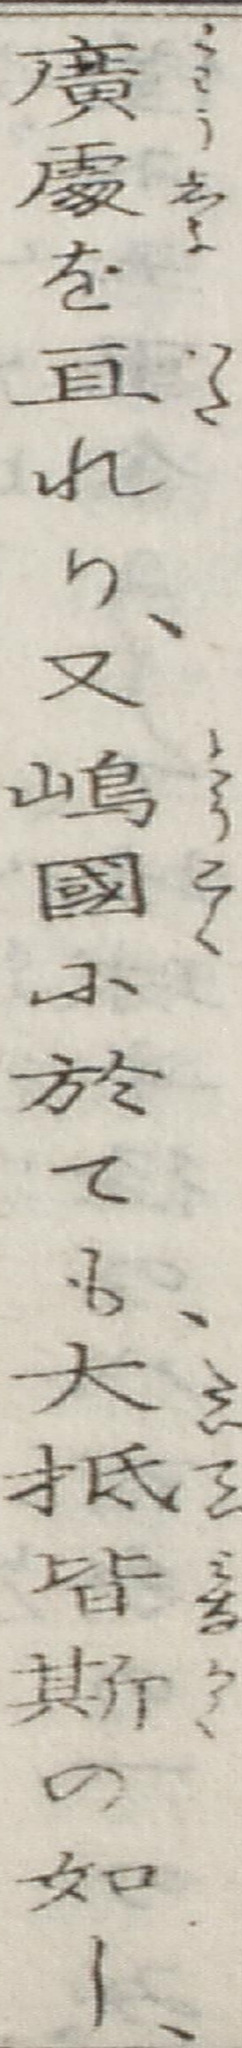広処を亘れり、又島国に於ても、大抵皆斯の如し、
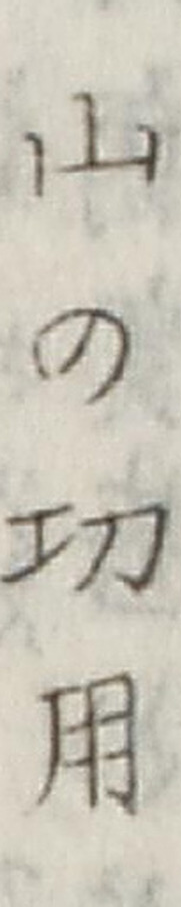山の功用
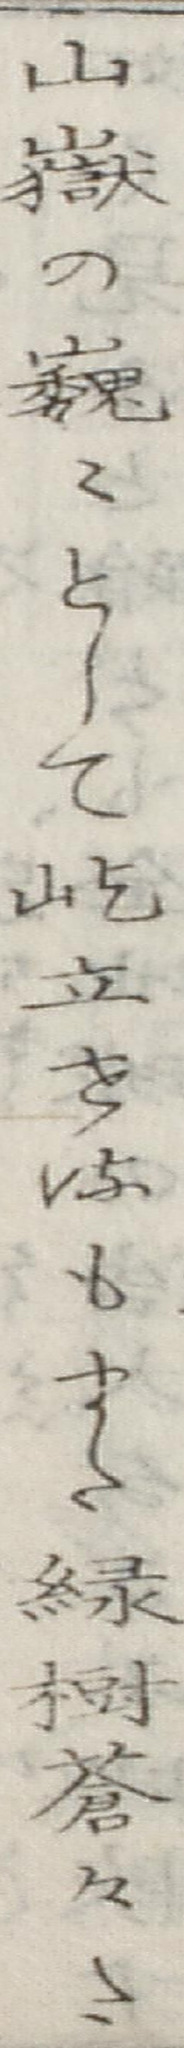山岳の巍〻として屹立せるも、また緑樹蒼々た
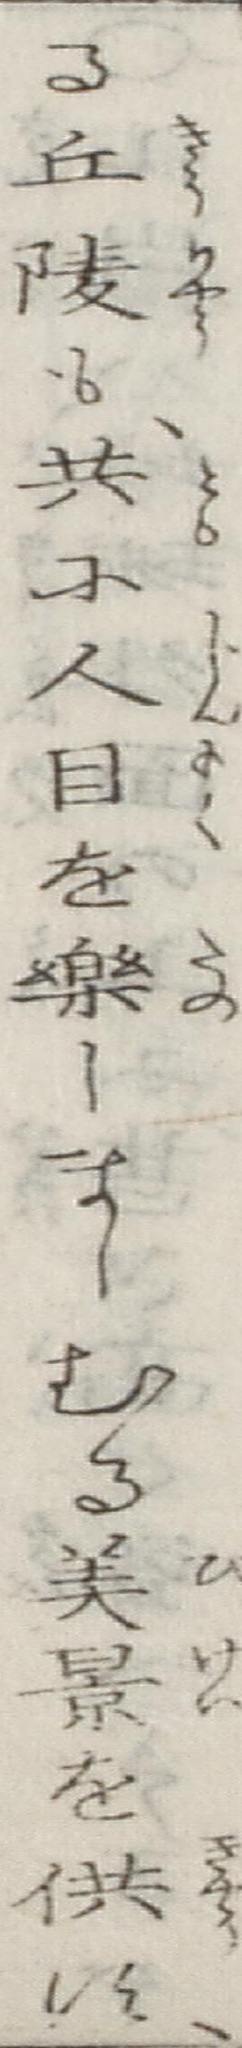る丘陵も、共に人目を楽しましむる美景を供す、
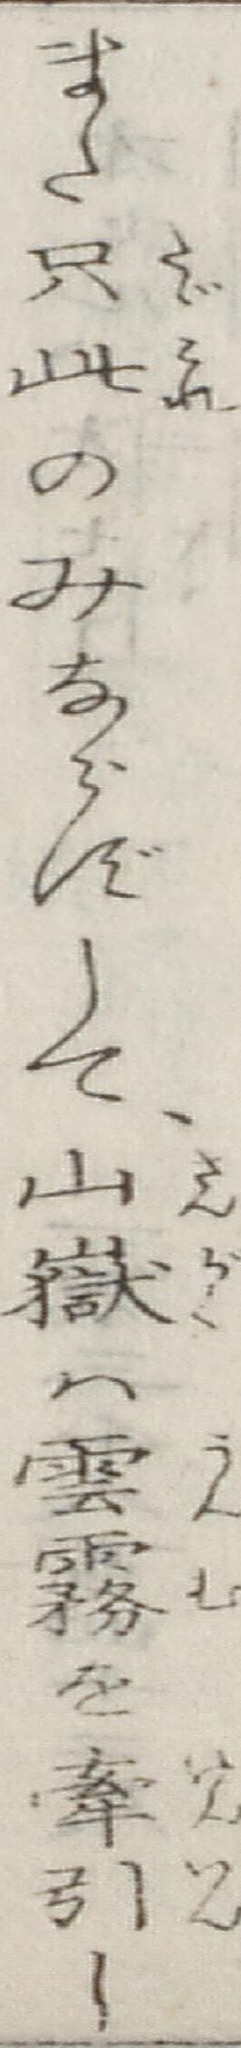また只此のみならずして、山岳は雲霧を牽引し
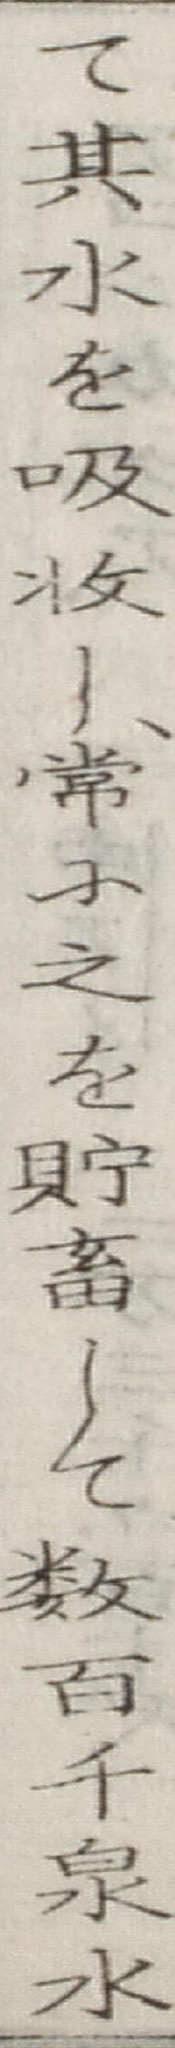て、其水を吸収し，常に之を貯蓄して、数百千泉水
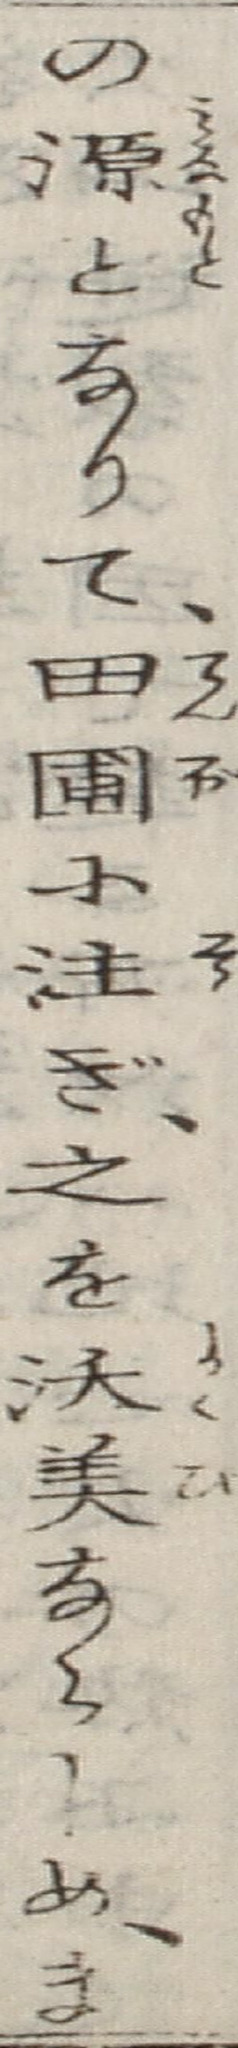の源となりて、田圃に注ぎ、之を沃美ならしめ、ま
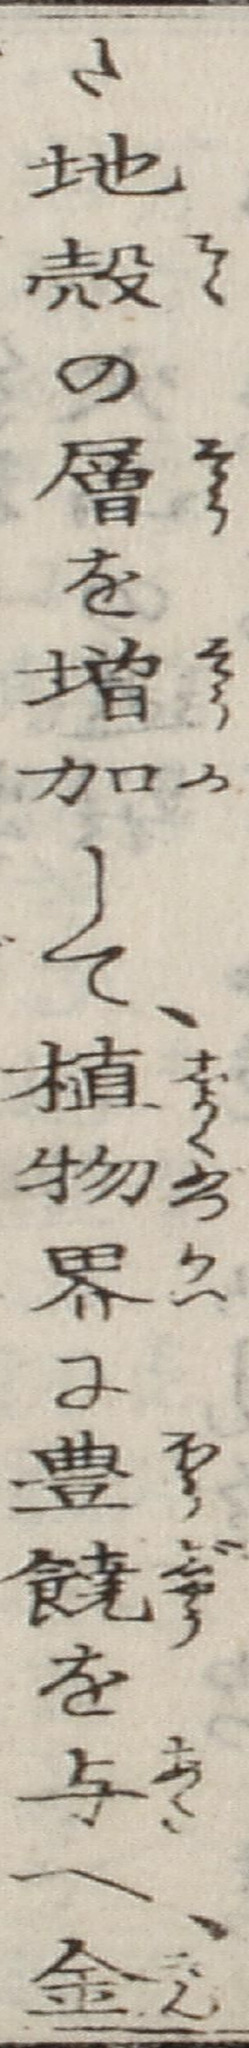た地殻の層を増加して、植物界に豊穣を与へ、金
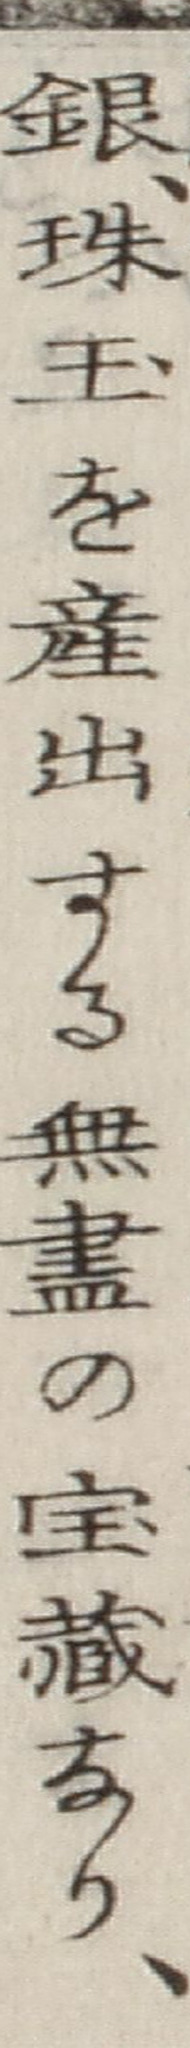銀、珠玉を産出する無尽の宝蔵なり、
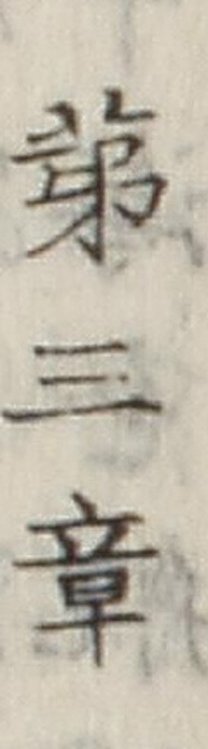第三章
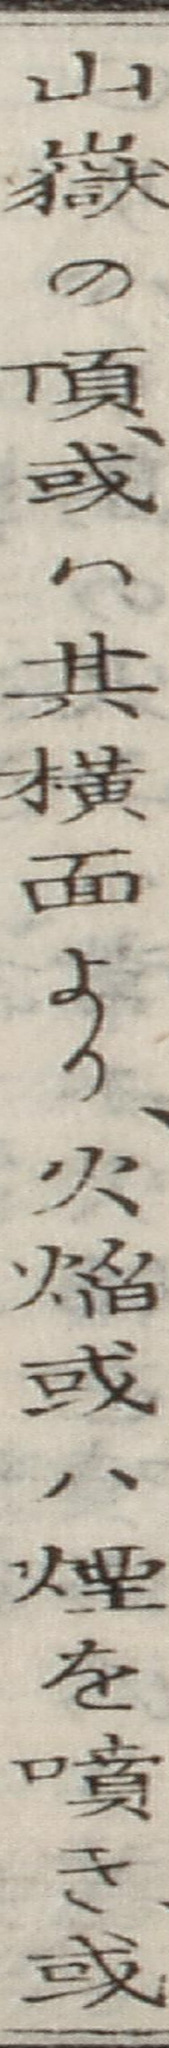山岳の頂、或は其横面より、火炎或は煙を噴き、或
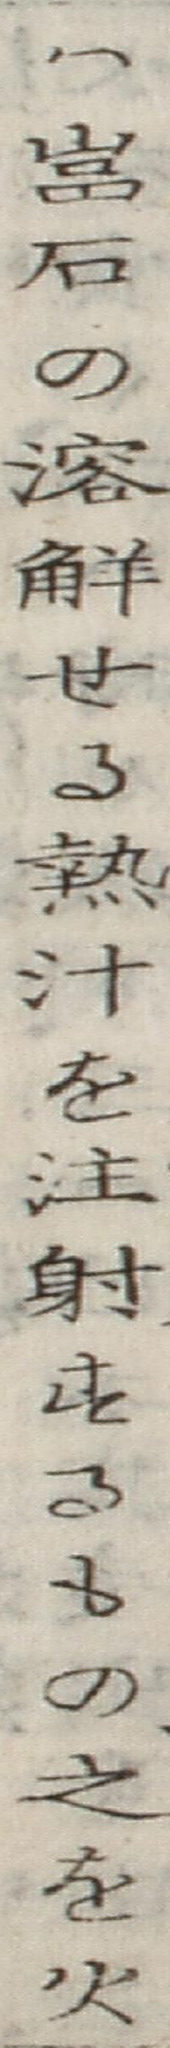は岩石の溶解せる熱汁を注射せるもの、之を火
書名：訓蒙　天然地理學　上
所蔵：東京大学地震研究所図書室 Earthquake Research Institute Library, The University of Tokyo, JAPAN
